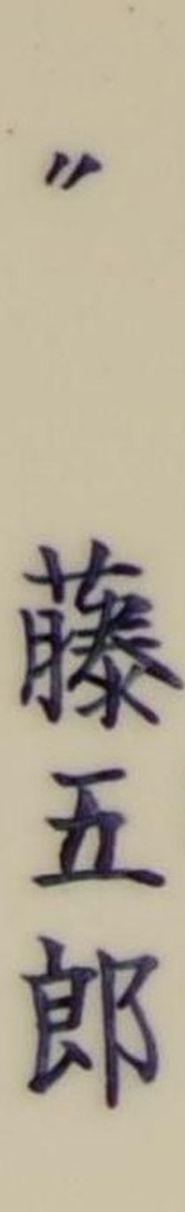藤五郎
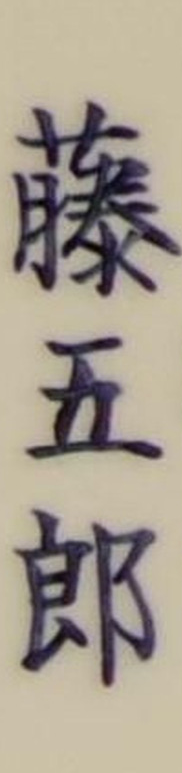藤五郎
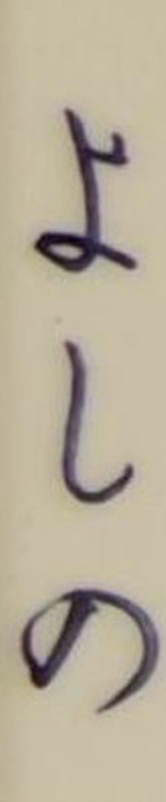よしの

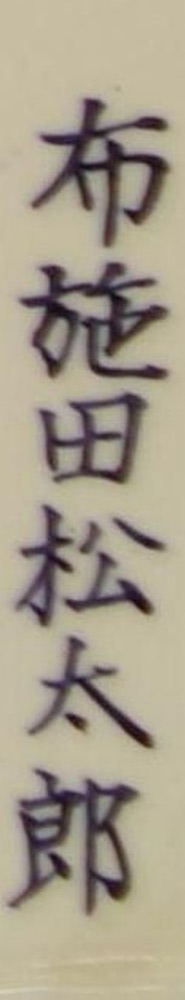布施田松太郎
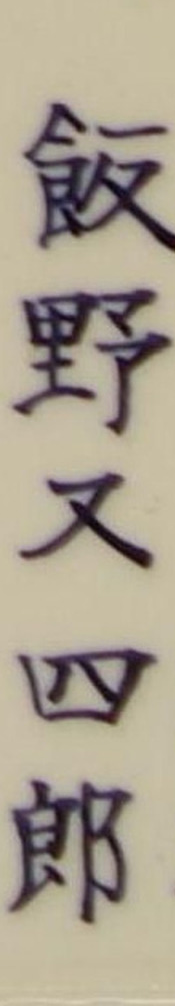飯野又四郎
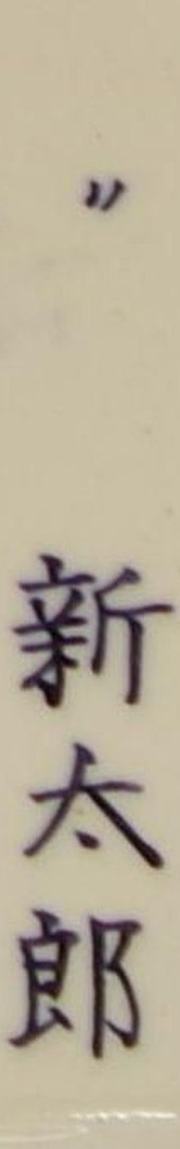新太郎
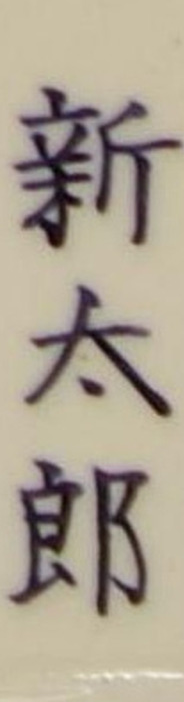新太郎
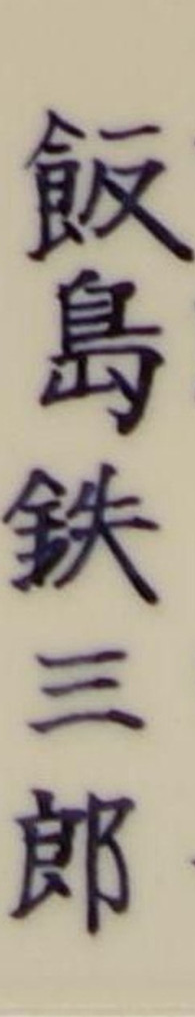飯島鉄三郎
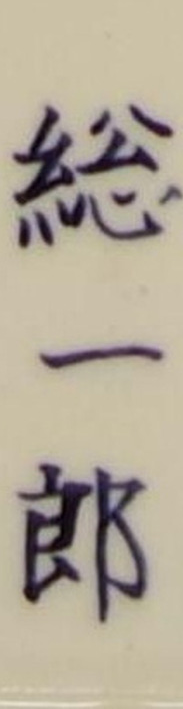総一郎
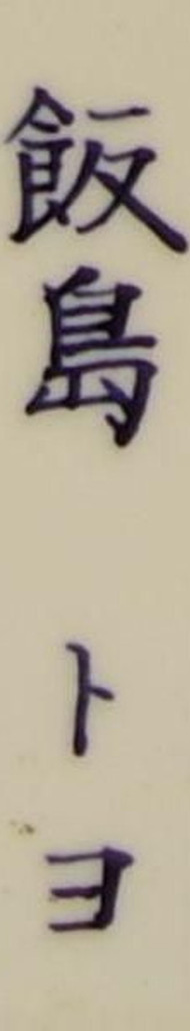飯島トヨ
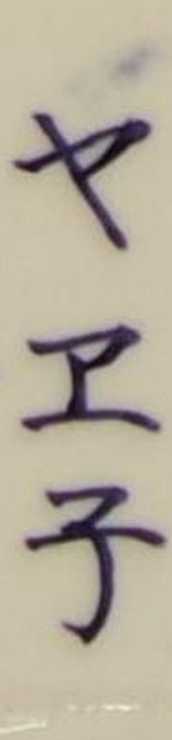やヱ子
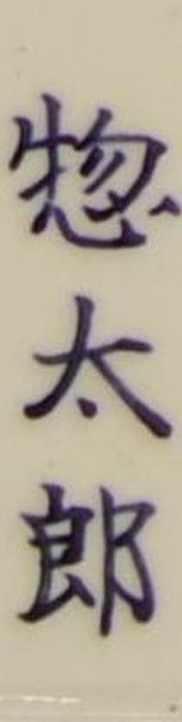惣太郎

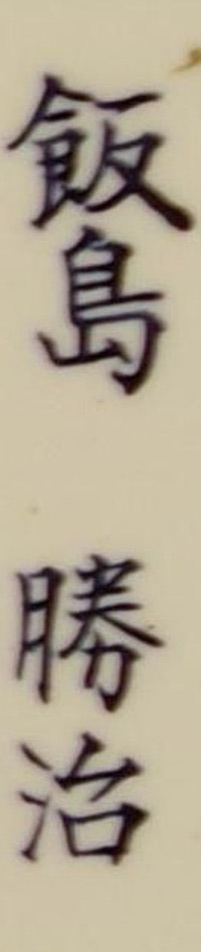飯島勝治
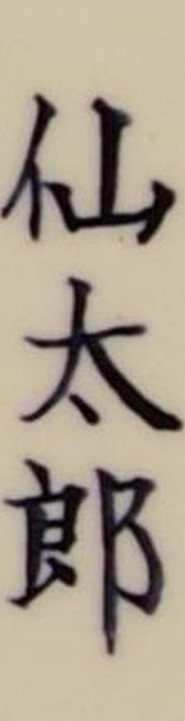仙太郎
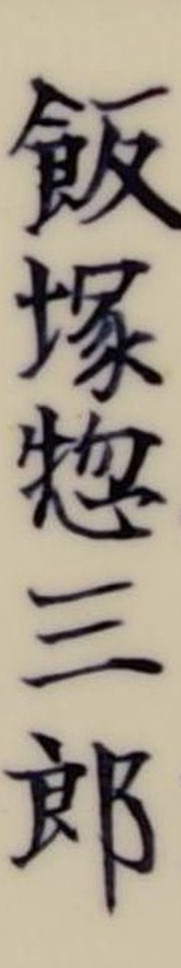飯塚惣三郎
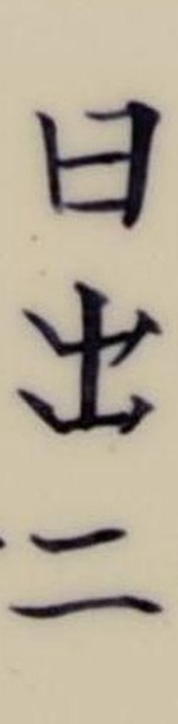日出二
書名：A~D
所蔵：koyasan kongobuji
